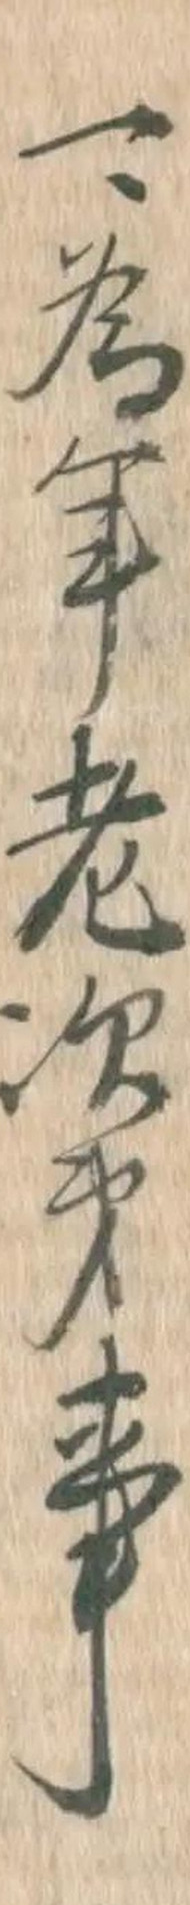可為年老次第事
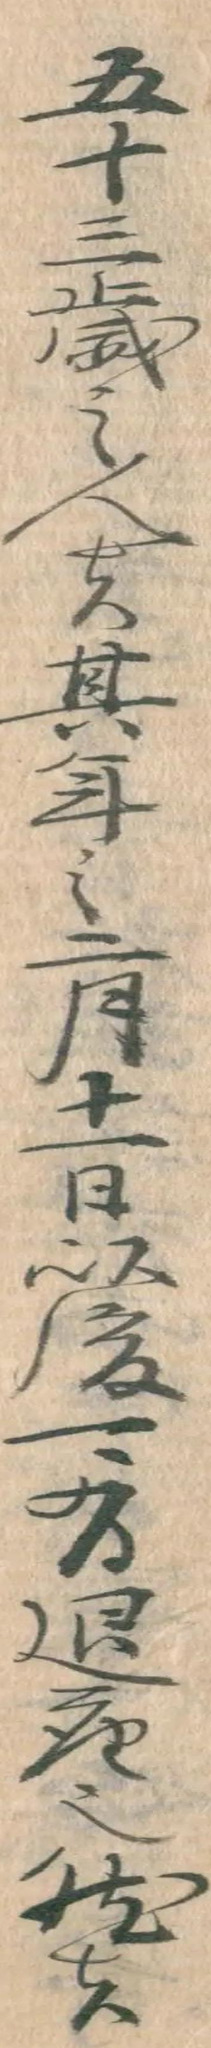一五十三歳之人は其年之二月十一日以後可有退座也然は
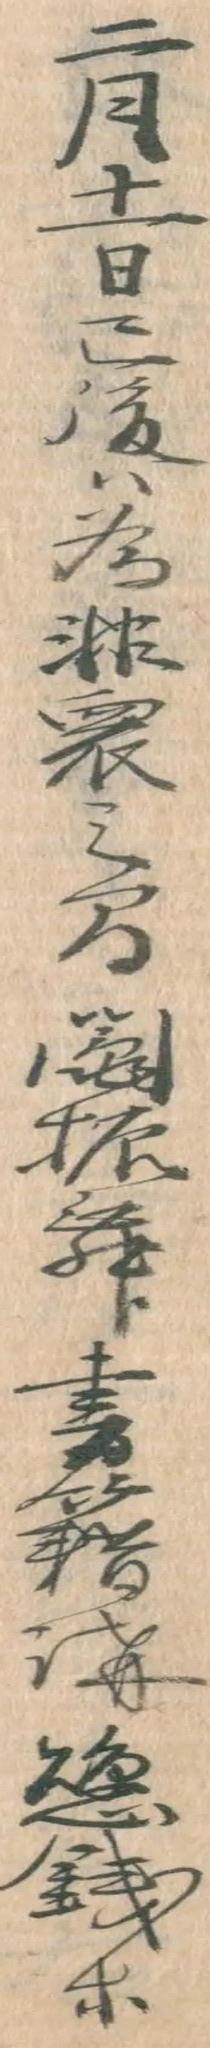二月十一日已後ハ為非衆之間鬮振舞ト書籍講懸銭等

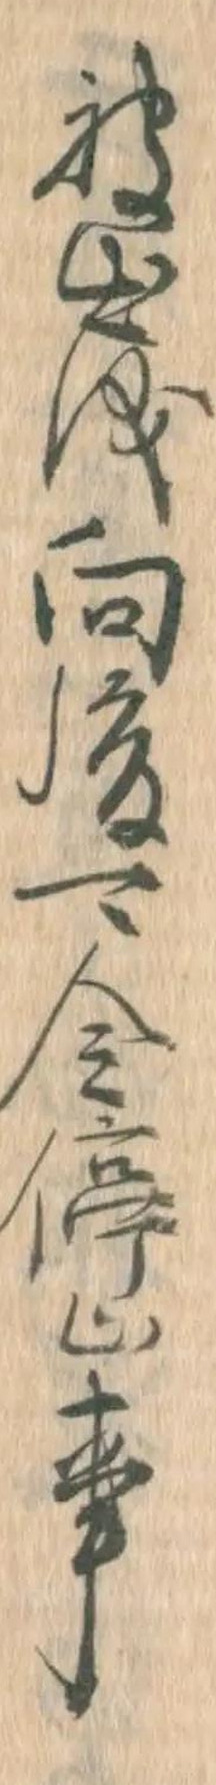被出儀向後可令停止事
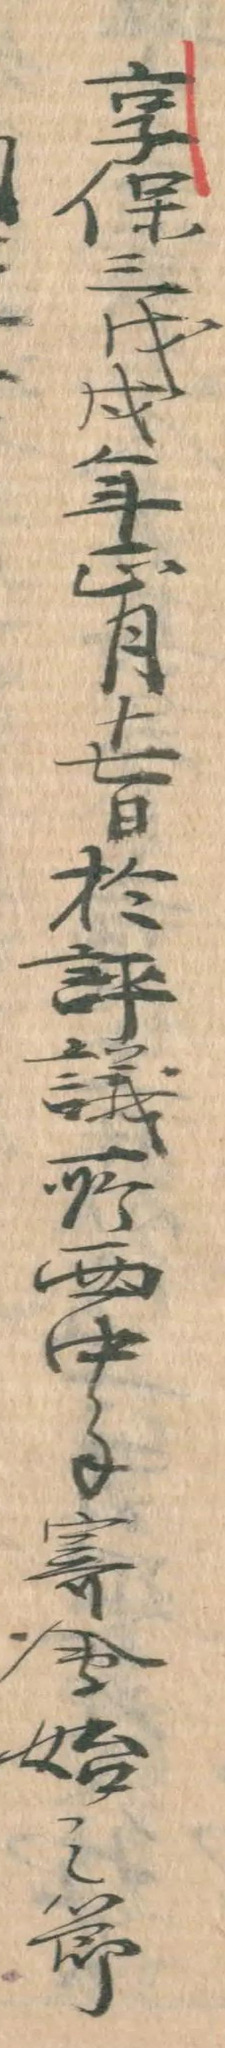享保三戌戌年正月十七日於評議所西中手寄會始之節
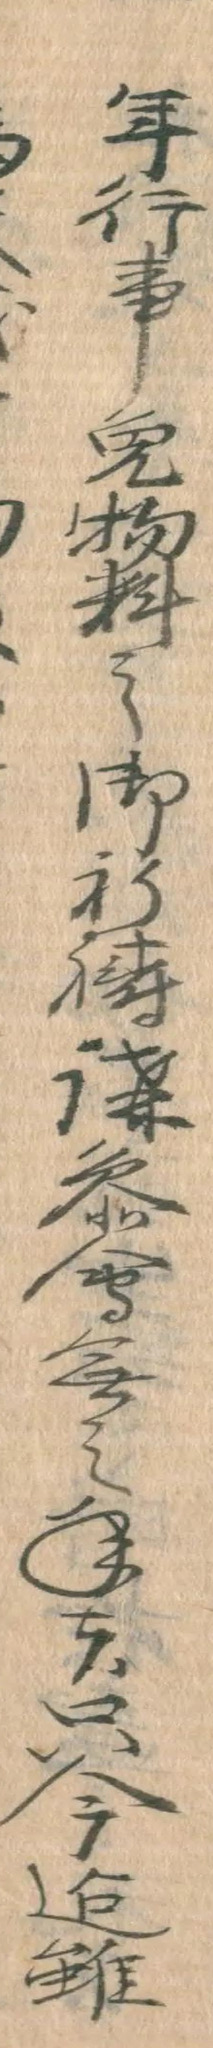一年行事免物料之御祈祷講参會無之年は只今迄難
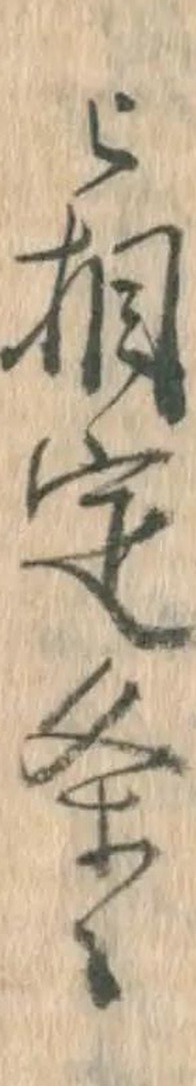被相定条々
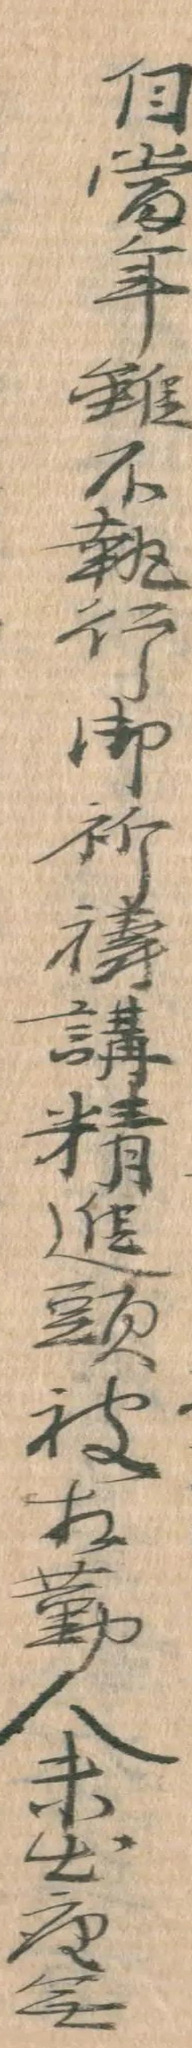一自當年雖不執行御祈祷講精進頭被相勤人未出座無
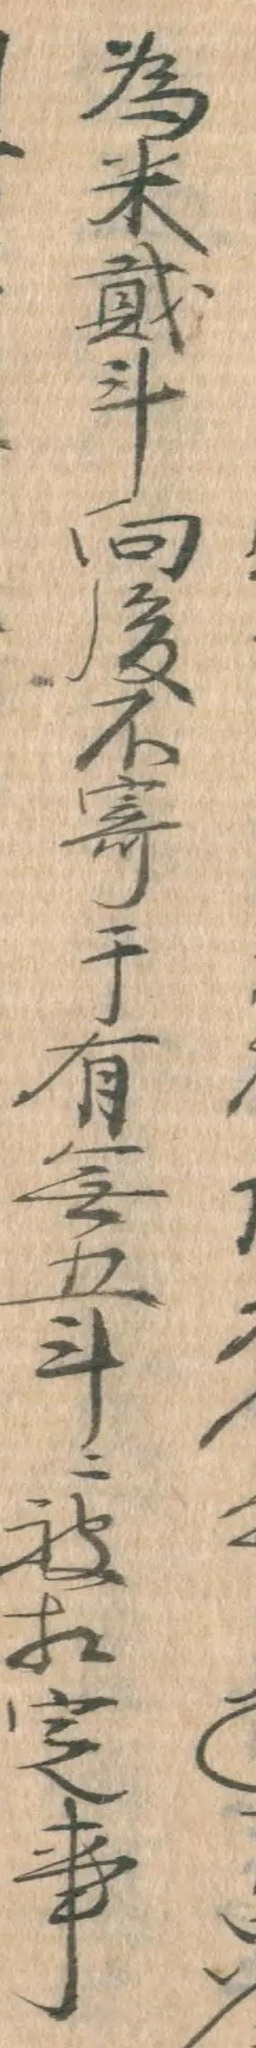為米弐斗向後不寄于有無五斗ニ被相定事
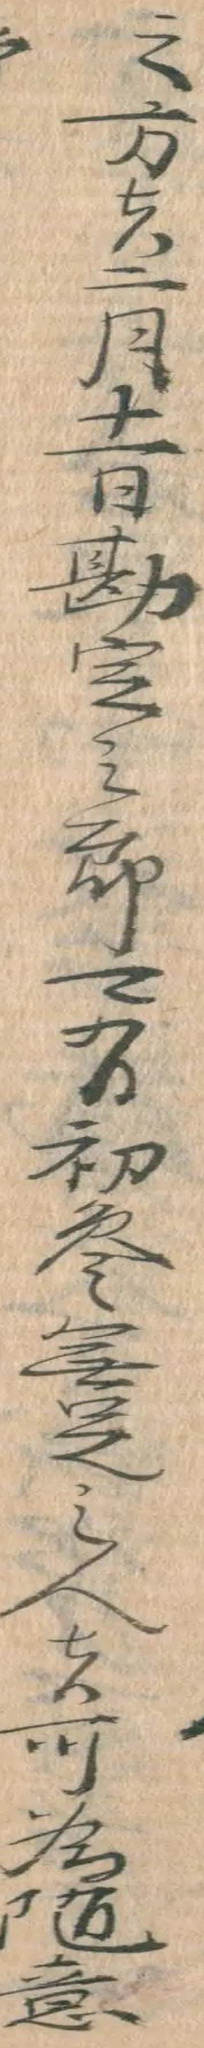之方は二月十一日勘定之節可有初参無足之人は可為随意
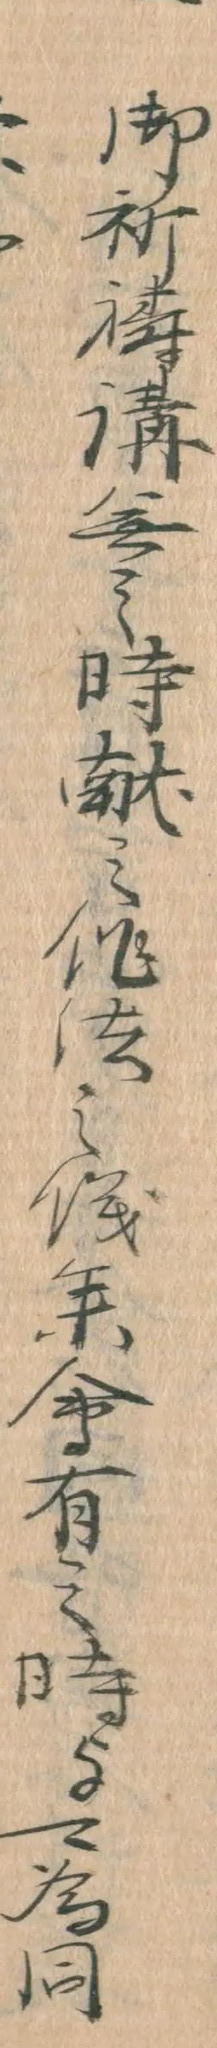一御祈祷講無之時献之作法之儀参會有之時と可為同
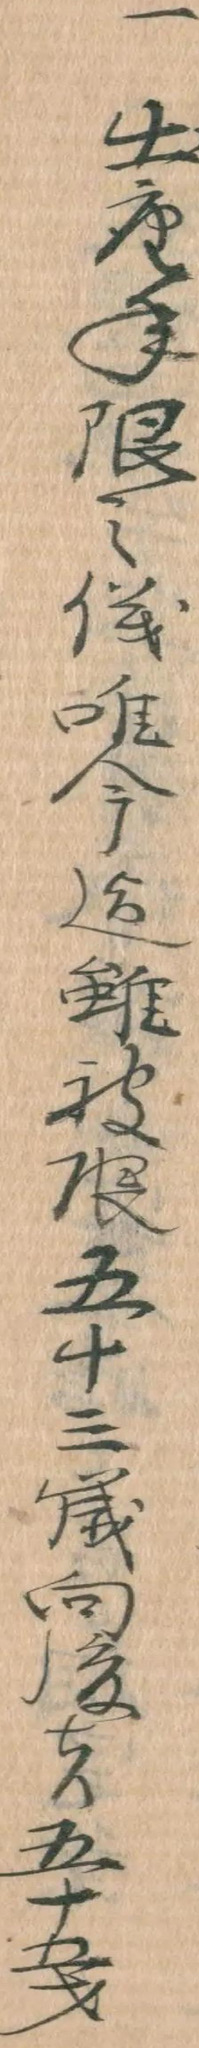一出座年限之儀唯今迄雖被限五十三歳向後は五十五才
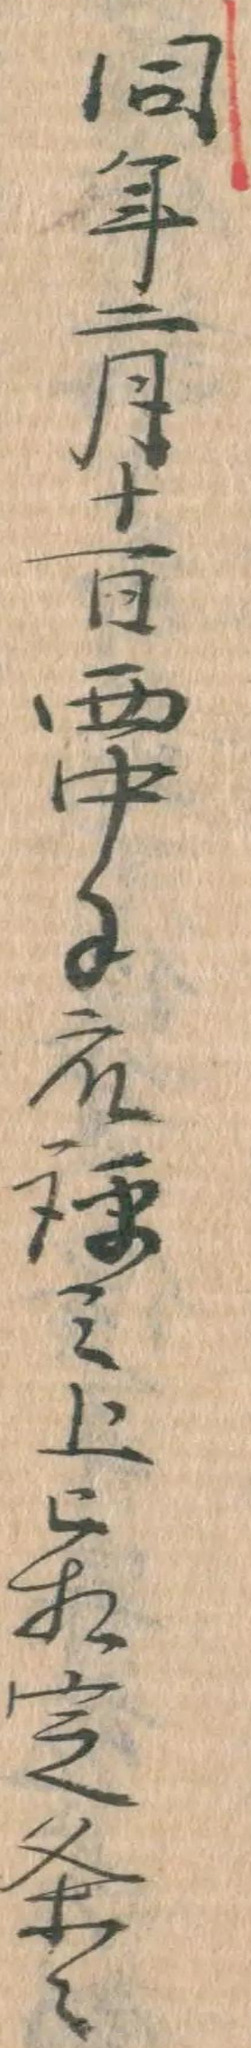同年二月十一日西中衆評之上被相定条々
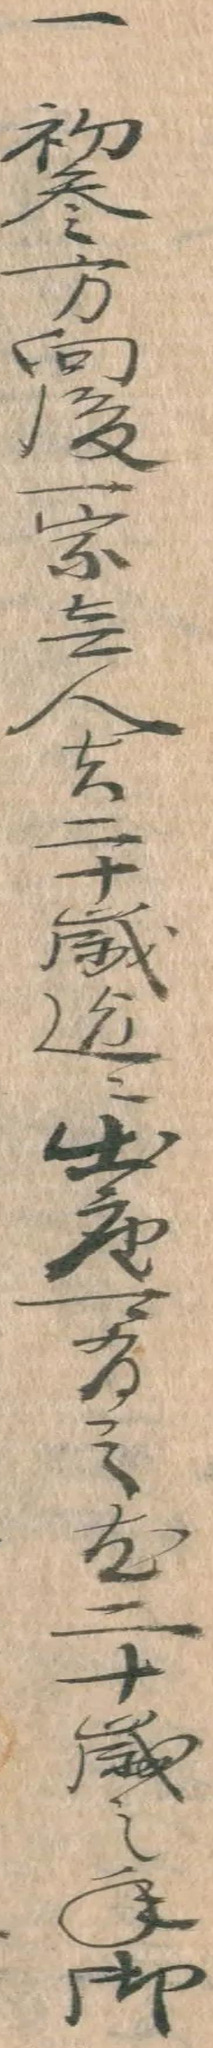一初参方向後一家壱人は二十歳迄に出座可有之尤二十歳之年御
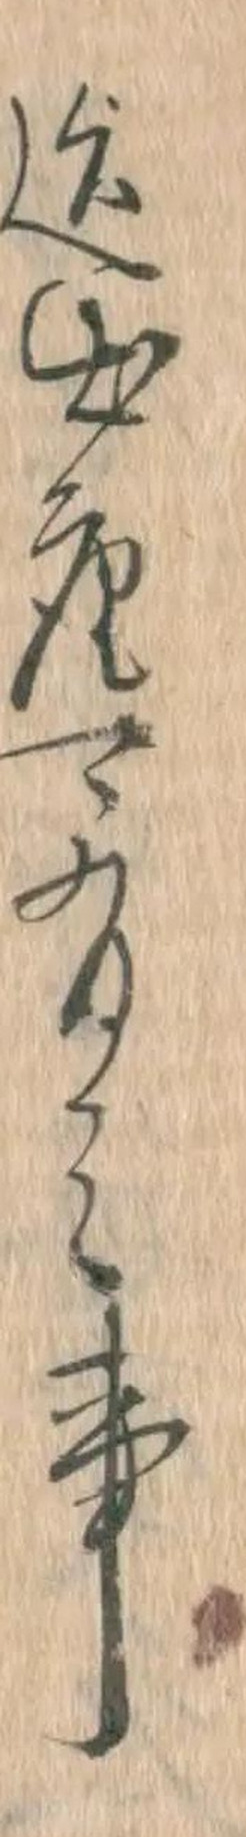迄出座可有之事
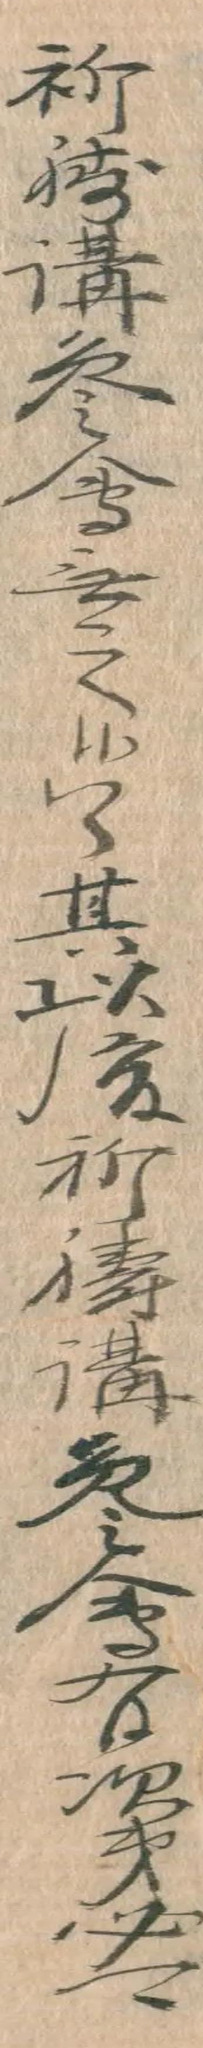祈祷講参會無之候ハヽ其以後祈祷講義参會有次第必可
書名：賀茂社記録. 第29冊
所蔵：国立国会図書館 National Diet Library, JAPAN
